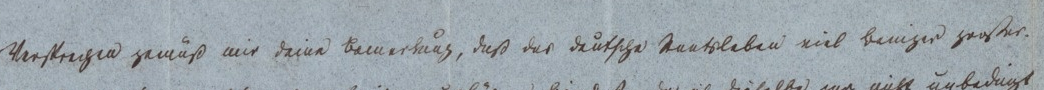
Versprechen gemäß mir Deine Bemerkung, daß das deutsche Staatsleben viel weniger großar-
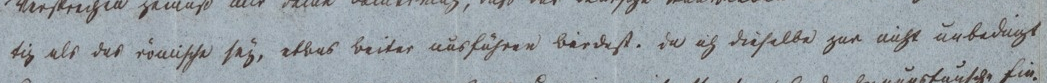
tig als das römische sey, etwas weiter ausführen würdest. Da ich dieselbe gar nicht unbedingt
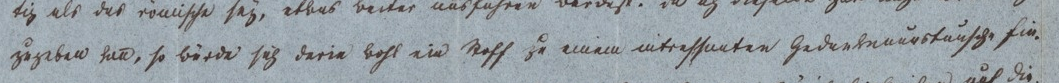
zugeben kann, so würde sich darin wohl ein Stoff zu einem intressanten Gedankenaustausche fin-
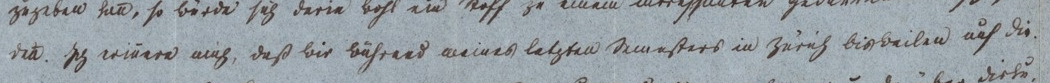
den. Ich erinnere mich, daß wir während meines letzten Semesters in Zürich bisweilen auf die-
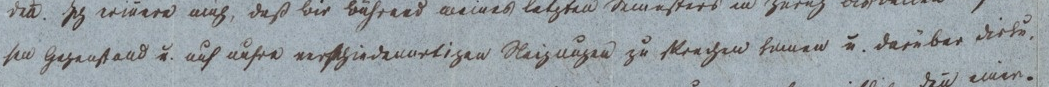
sen Gegenstand u. auf unsre verschiedenartigen Neigungen zu sprechen kamen u. darüber disku-
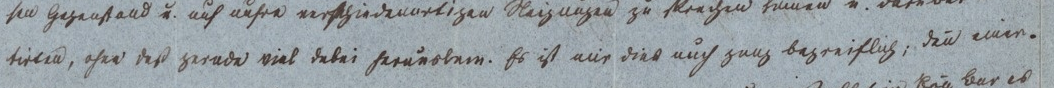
tirten, ohne daß gerade viel dabei herauskam. Es ist mir dies auch ganz begreiflich; denn einer-
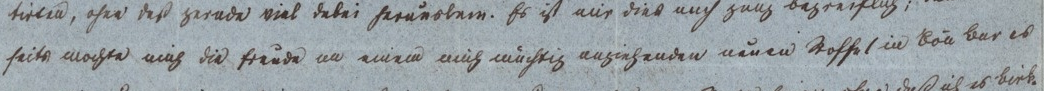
seits mochte mich die Freude an einem mich mächtig anziehenden neuen Stoffe (in Bonn war es
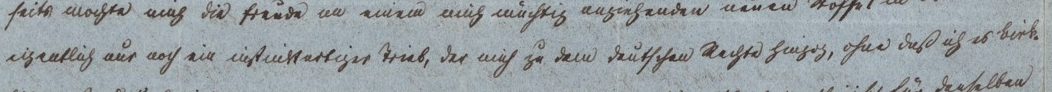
eigentlich nur noch ein instinktartiger Trieb, der mich zu dem deutschen Rechte hinzog, ohne daß ich es wirk-
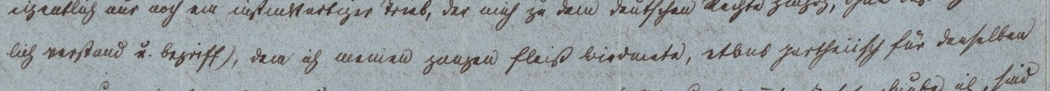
lich verstand u. begriff), dem ich meinen ganzen Fleiß wiedmete, etwas partheiisch für denselben
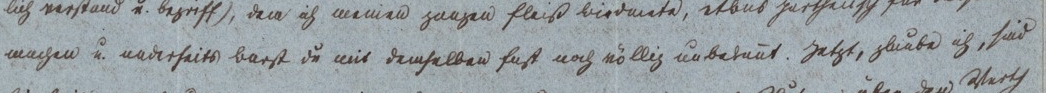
machen u. anderseits warst Du mit demselben fast noch völlig unbekannt. Jetzt, glaube ich, sind
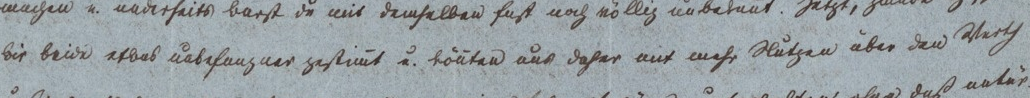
wir beide etwas unbefangner gestimmt u. könnten uns daher mit mehr Nutzen über den Werth
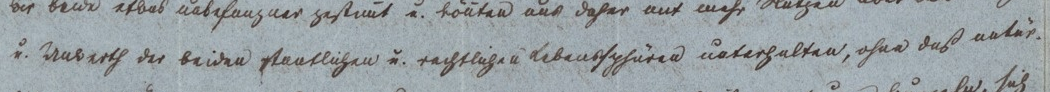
u. Unwerth der beiden staatlichen u. rechtlichen Lebenssphären unterhalten, ohne daß natür-
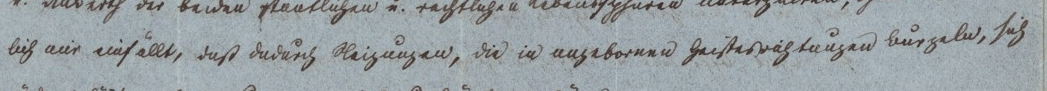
lich mir einfällt, daß dadurch Neigungen, die in angebornen Geistesrichtungen wurzeln, sich
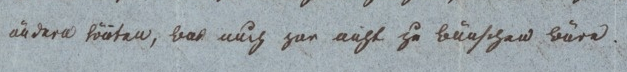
ändern könnten, was auch gar nicht zu wünschen wäre.
